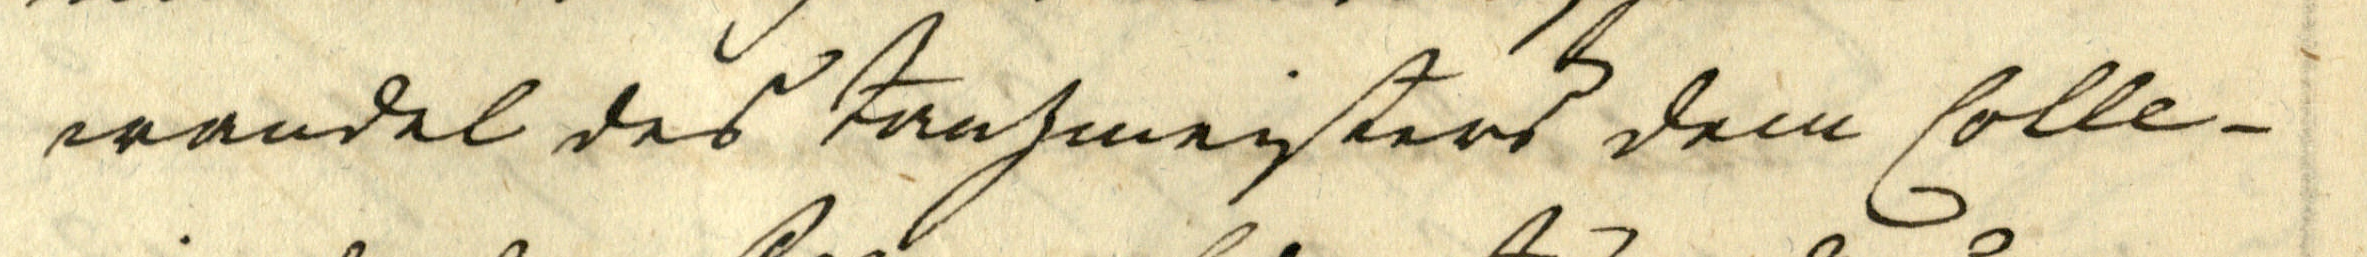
wandel des Tanzmeisters dem Colle¬
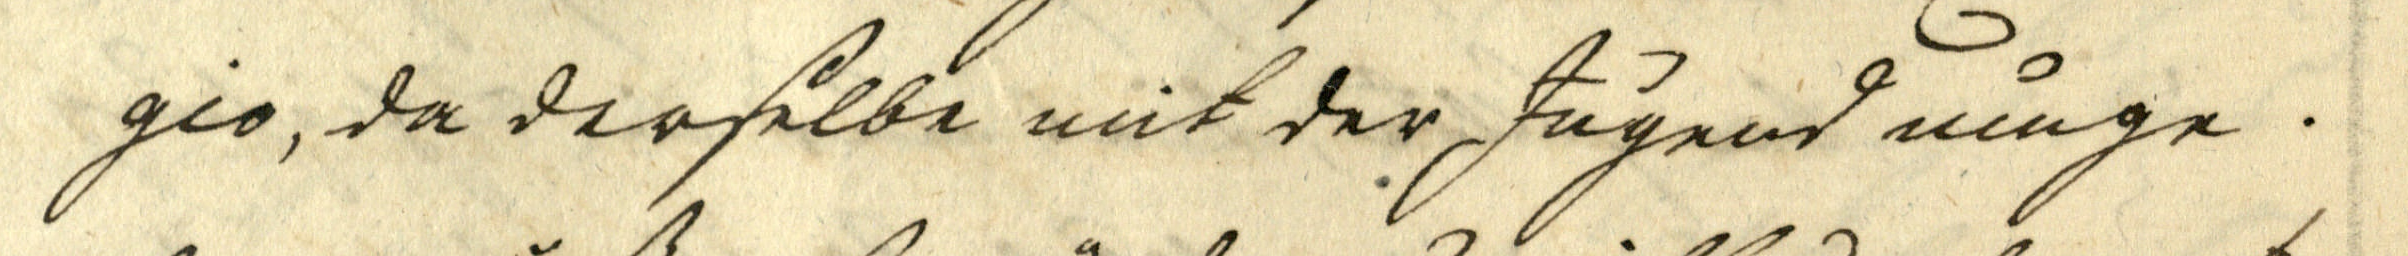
gio, da derselbe mit der Jugend umge¬
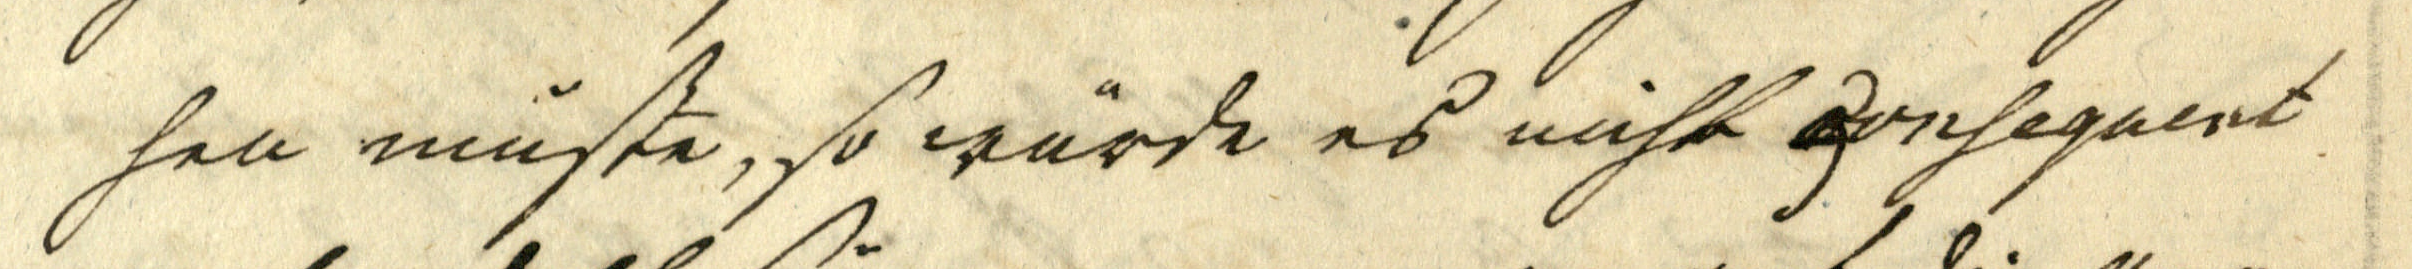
hen müßte, so würde es nicht consequent
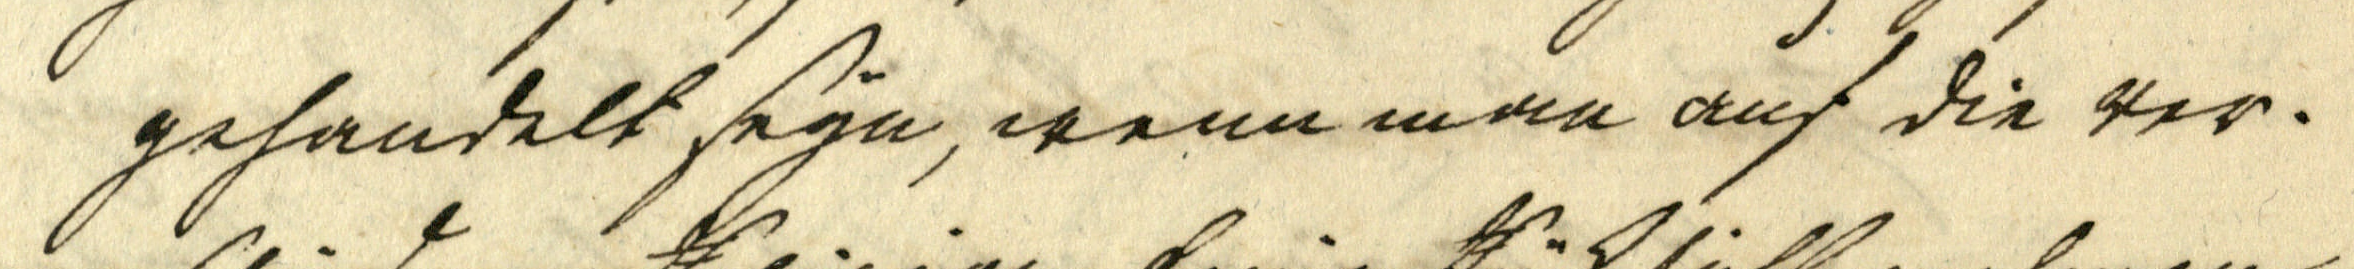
gehandelt seÿn, wenn man auf die ver-
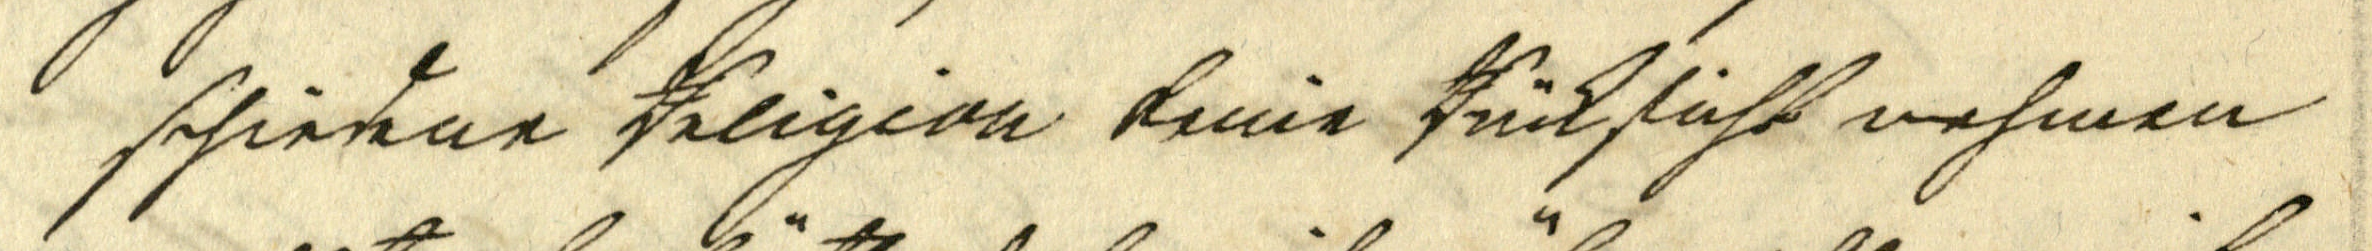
schiedene Religion keine Rücksicht nehmen
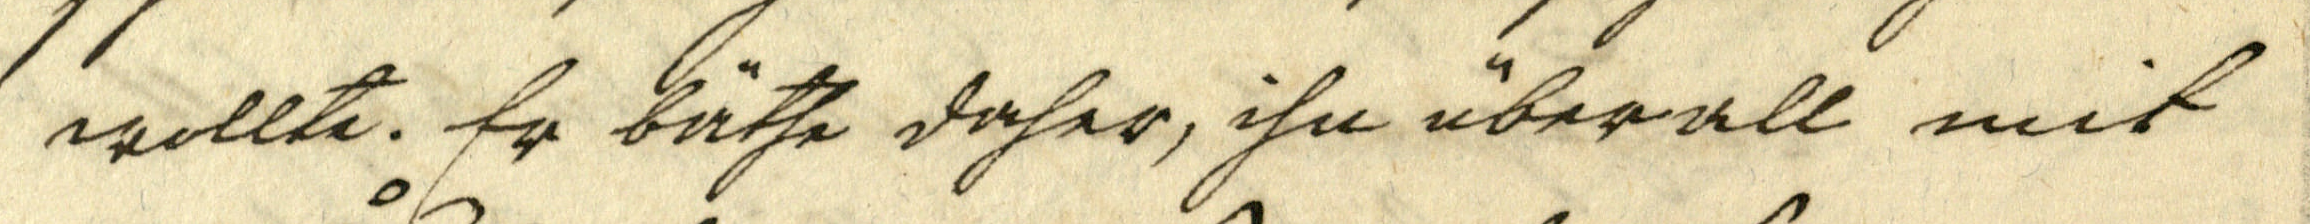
wollte. Er bäthe daher, ihn überall mit
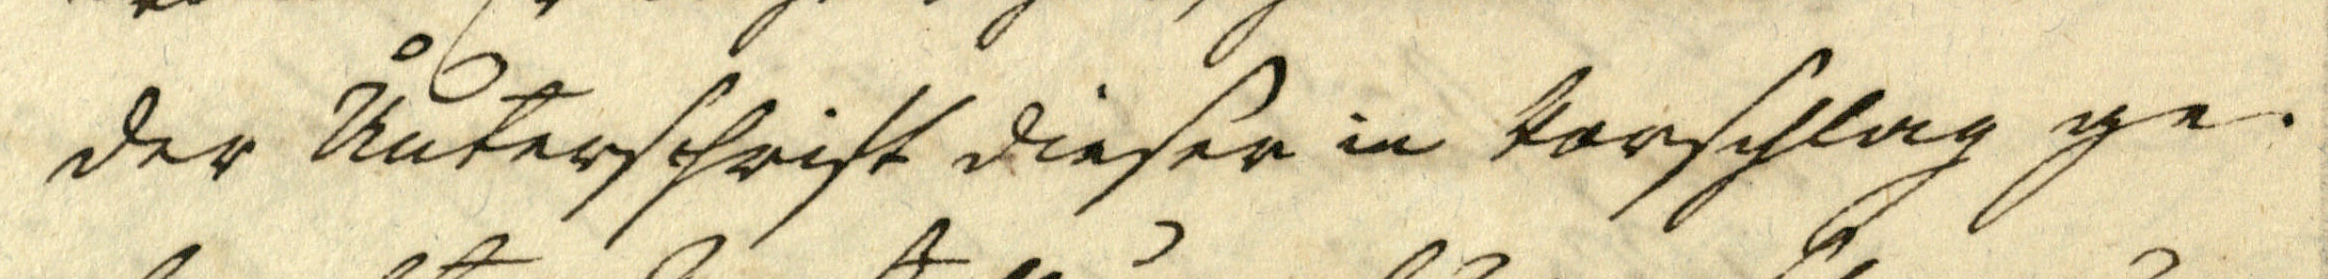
der Unterschrift dieser in Vorschlag ge¬
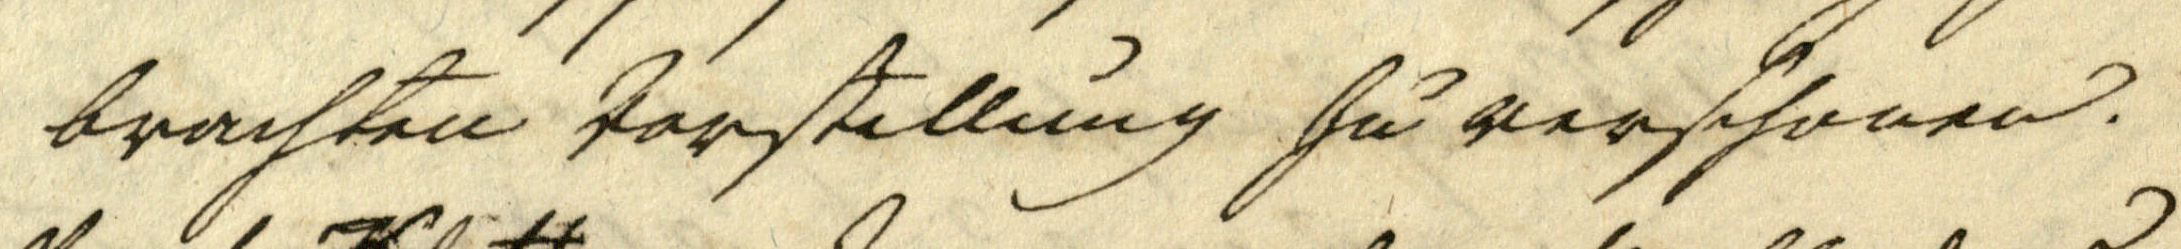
brachten Vorstellung zu verschonen.
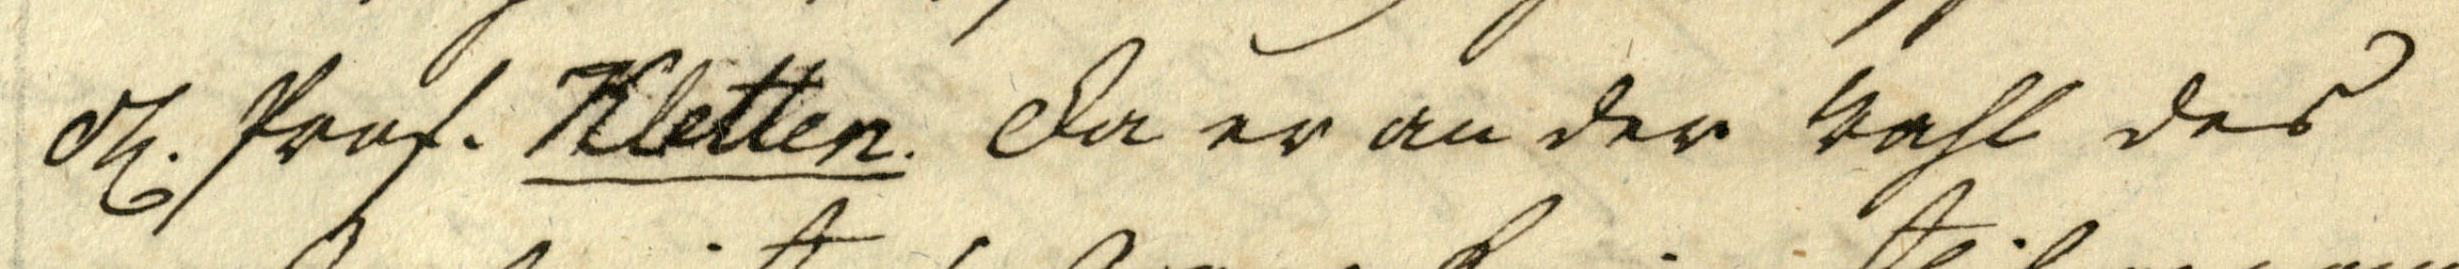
dh. Prof. Kletten. Da er an der Wahl des
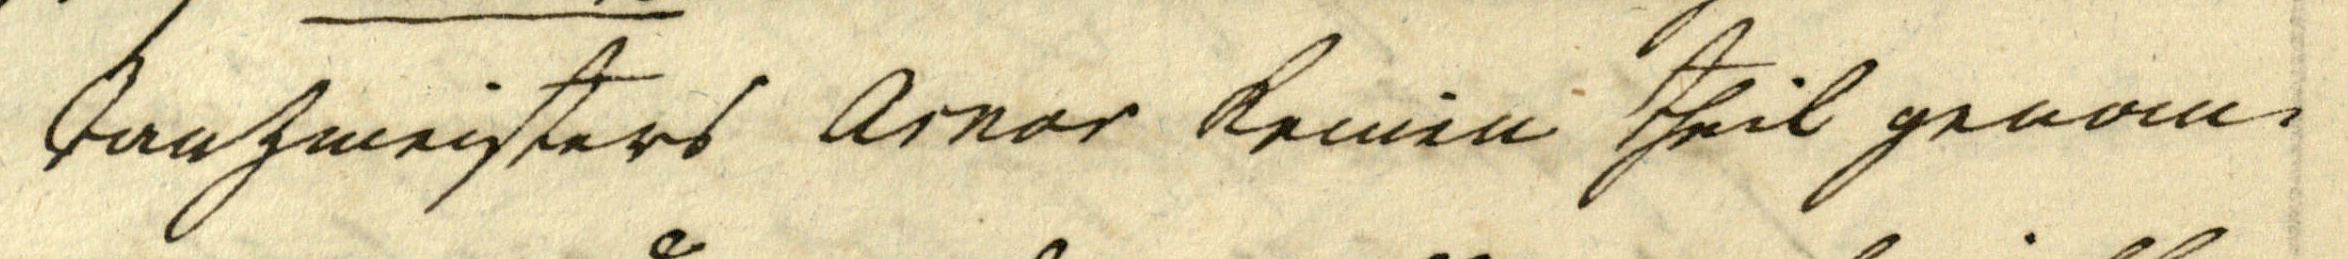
Tanzmeisters Amor keinen Theil genom¬
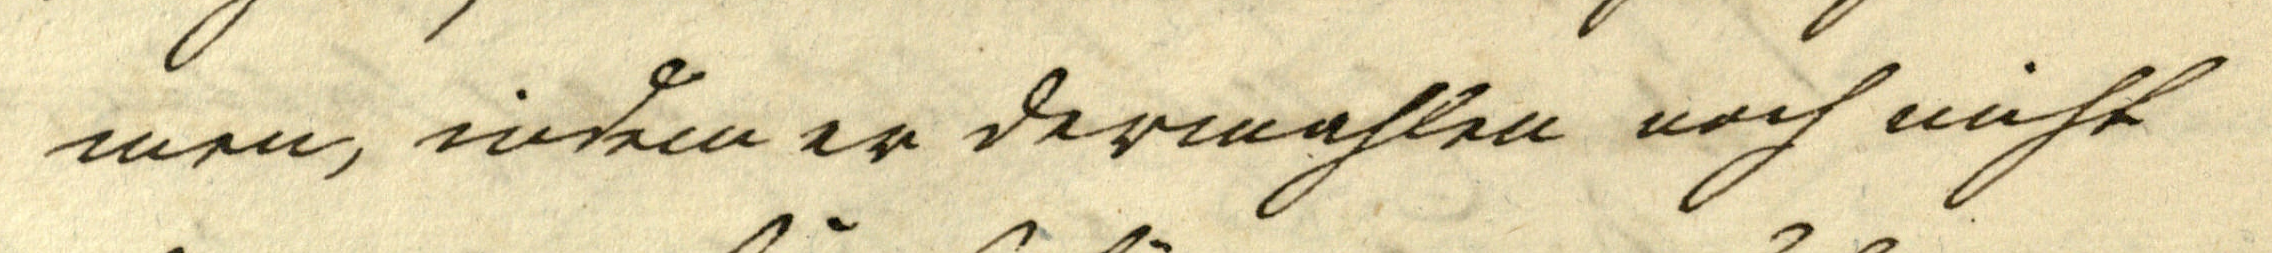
men, indem er dermahlen noch nicht
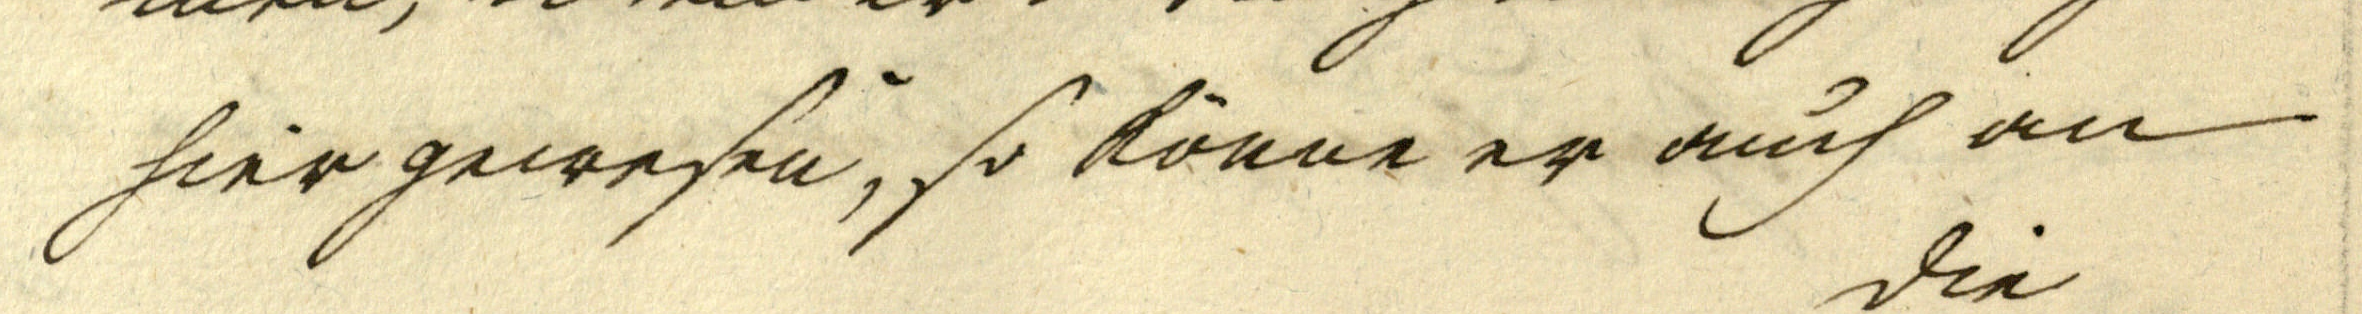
hier gewesen, so könne er auch an
